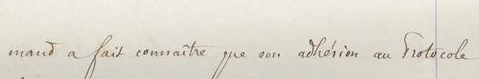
mand a fait connaître que son adhésion au Protocole
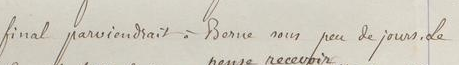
final parviendrait à Berne sous peu de jours. Le
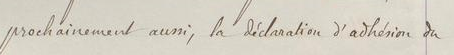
prochainement aussi, la déclaration d'adhésion du
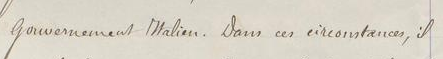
Gouvernement Italien. Dans ces circonstances, il
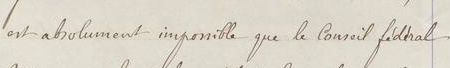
est absolument impossible que le Conseil fédéral
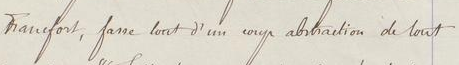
Francfort, fasse tout d'un coup abstraction de tout
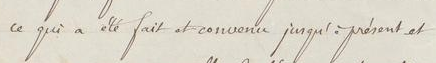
ce qui a été fait et convenu jusqu'à présent et
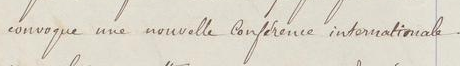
convoque une nouvelle Conférence internationale
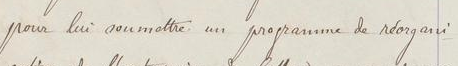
pour lui soumettre un programme de réorgani-
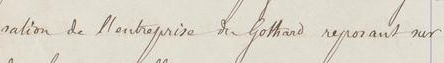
sation de l'entreprise du Gothard reposant sur
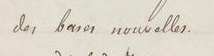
des bases nouvelles.
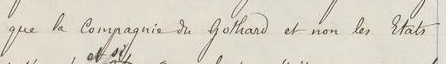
que la Compagnie du Gothard et non les Etats
